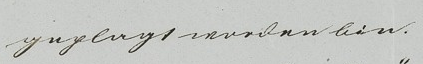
geplagt worden bin.
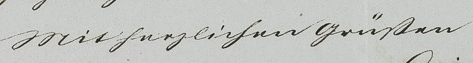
Mit herzlichen Grüßen
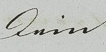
Dein
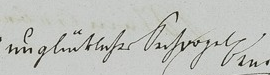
unglücklicher Pechvogel
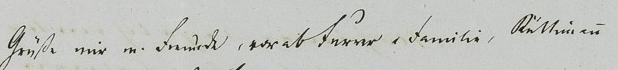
Grüße mir m. Freunde, vorab Furrer & Familie, Rüttimann
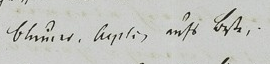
Blumer, Aepli aufs Beste.
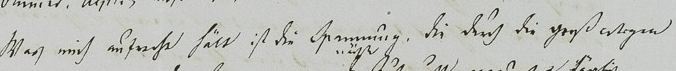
Was mich aufrecht hält ist die Spannung, die durch die grossartigen
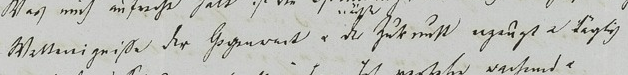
Weltereignisse der Gegenwart & die nächste Zukunft erzeugt & täglich
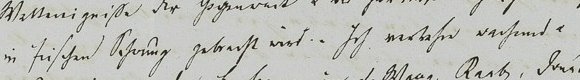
in frischen Schwung gebracht wird. Ich verkehre wachend &
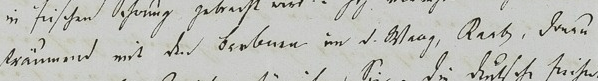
träumend mit den Beslenen un d. Wang, Raab, Donau
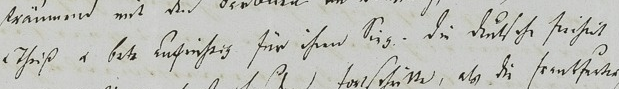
Theiss & bete aufrichtig für ihren Sieg. Die deutsche Freiheit
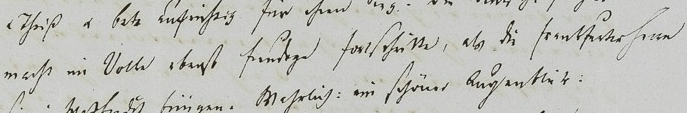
macht im Volke ebenso freudige Fortschritte, als die Frankfurter Herrn
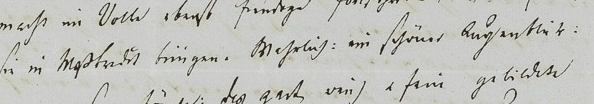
sie in Mißkredit bringen. Wahrlich: ein schöner Augenblick:
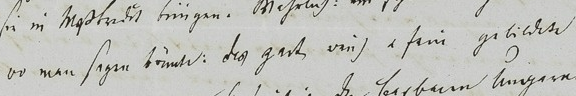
wo man sagen könnte: das zart, reich & fein gebildete
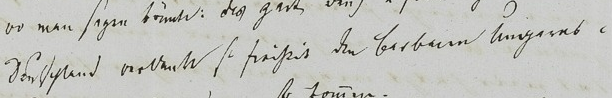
Deutschland verdankt s. Freiheit den Barbaren Ungarns.
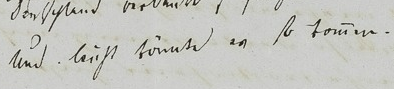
Und leicht könnte es so kommen.
